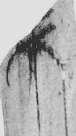○（奚）
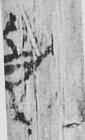飤（食）
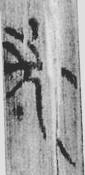先
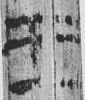王
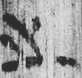之
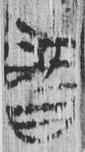智
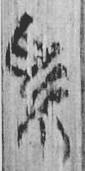○（奚）
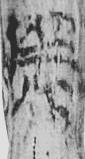備
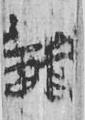○（聞）
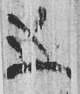之
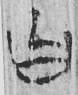曰
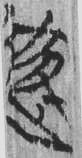○（升）
